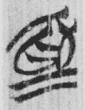爲
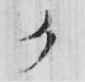人
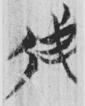俤（弟）
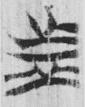者
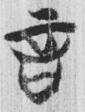言
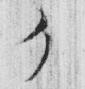人
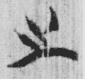之
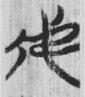俤（弟）
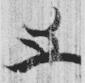之
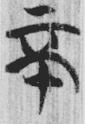不
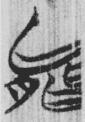能
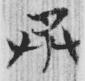丞（承）
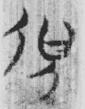○（兄）
